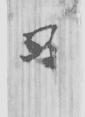邑
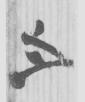之
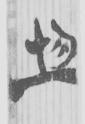{爪土}
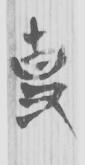吏
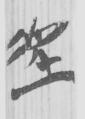𫊟
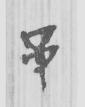邑
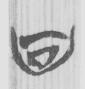昌
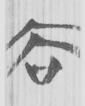去
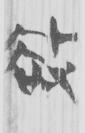{去攴}
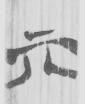亓
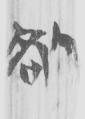咎
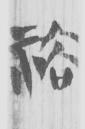祛
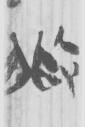{非攴}
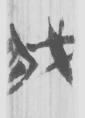我
